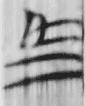馬
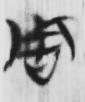周
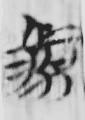駕
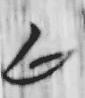㠯（以）
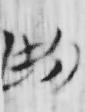○（廷）
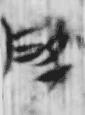阩
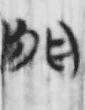門
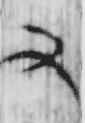又
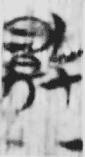敗
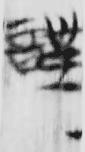諻
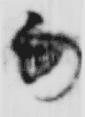句
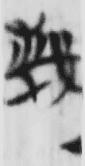○（剄）
